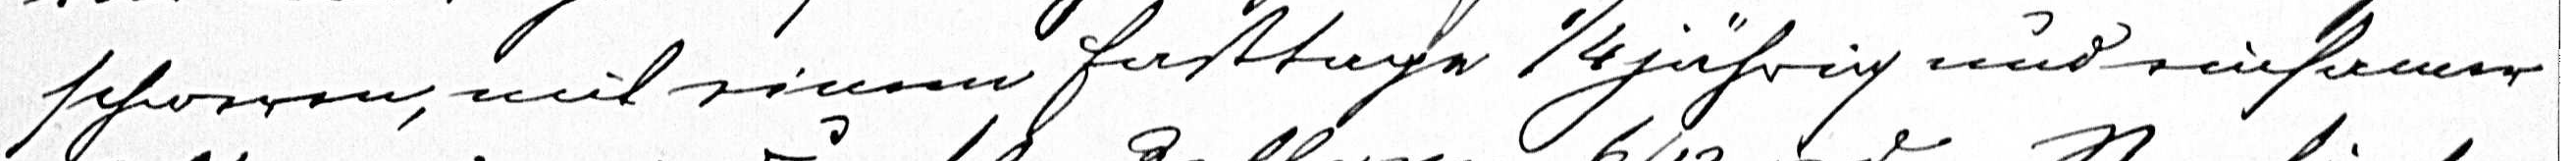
shcweren, mit einem Fasttage ¼ jährig und einsamer
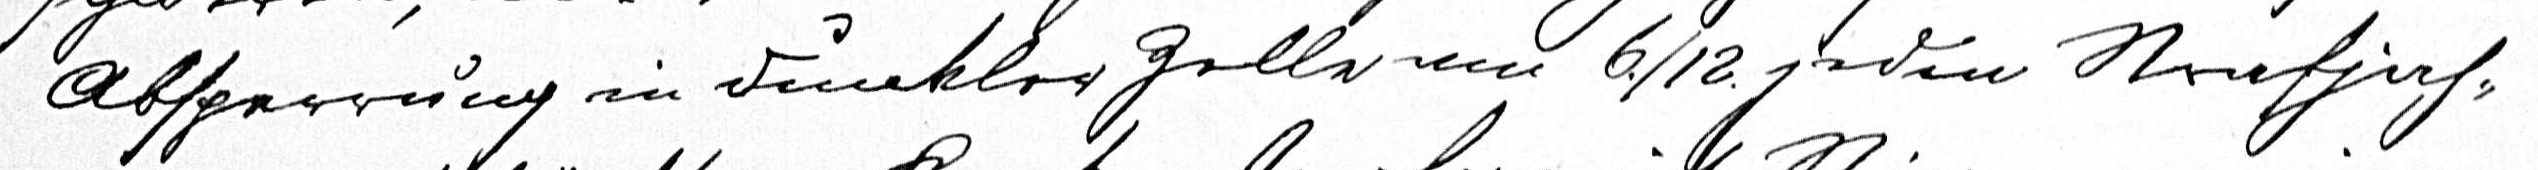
Absperrung in dunkler Zelle am 6/12 jeden Strafjah¬
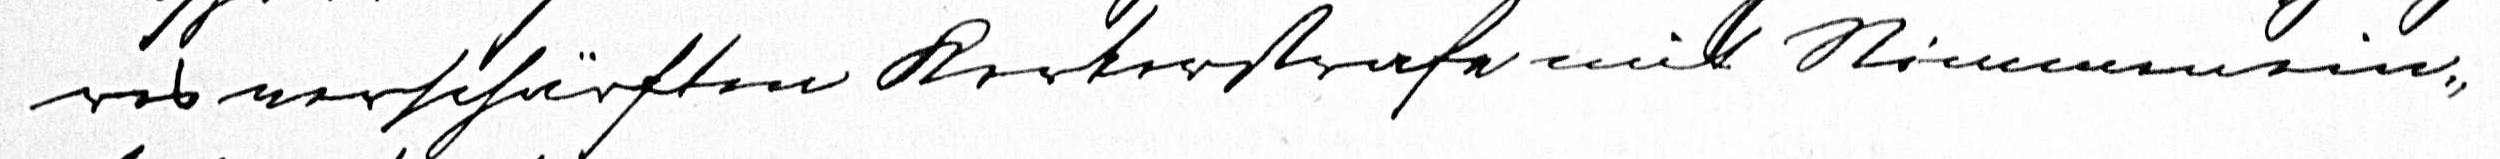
res verschärften Kerkerstrafe mit Stimmenein¬
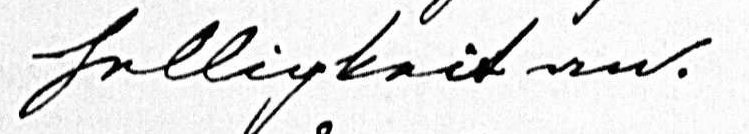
helligkeit an.
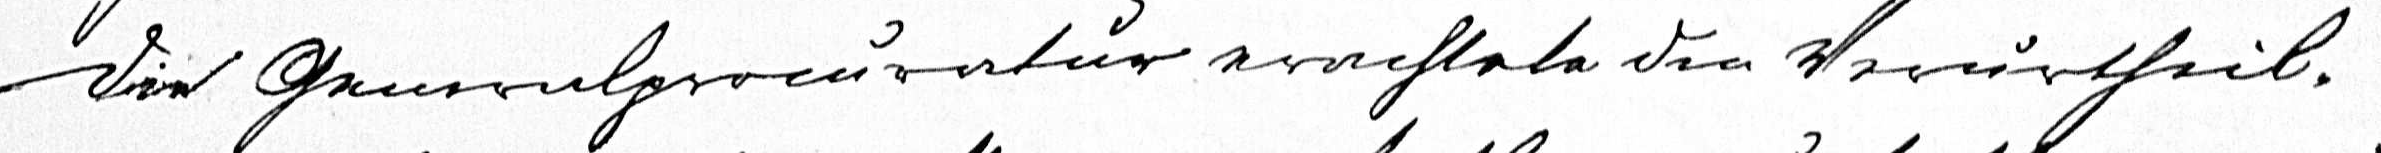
Die Generalprocuratur erachtete den Verurtheil¬
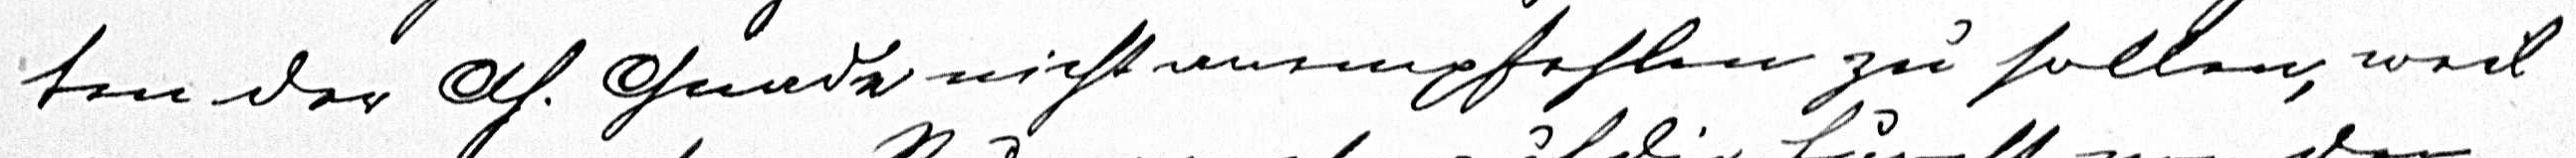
ten der Ah. Gnade nicht anempfehlen zu sollen, weil
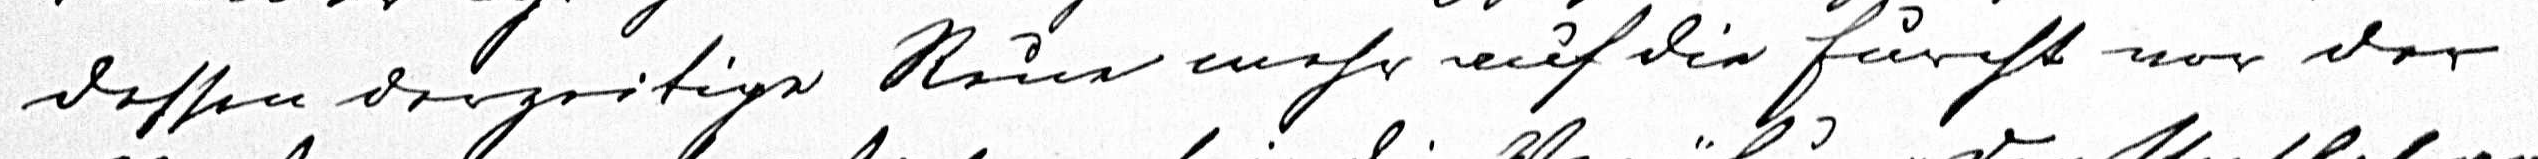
dessen derzeitige Reue mehr auf die Furcht vor der
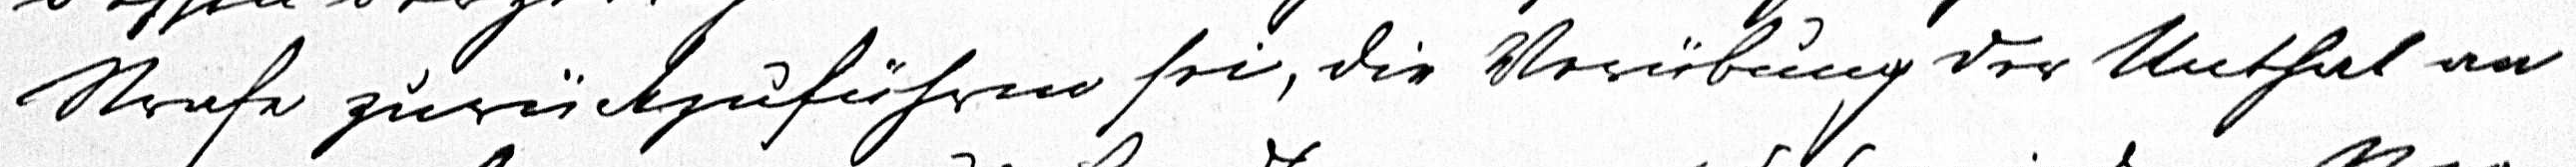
Strafe zurückzuführen sei, die Verübung der Unthat an
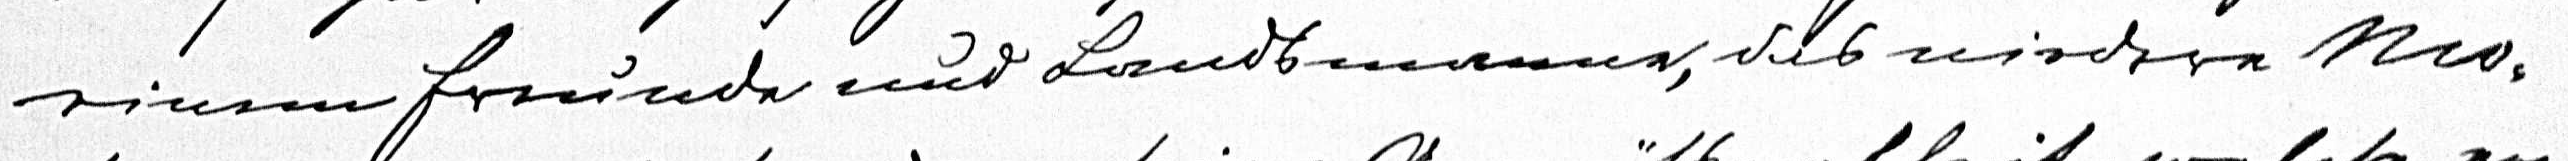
einem Freunde und Landsmanne, das niedere Mo¬
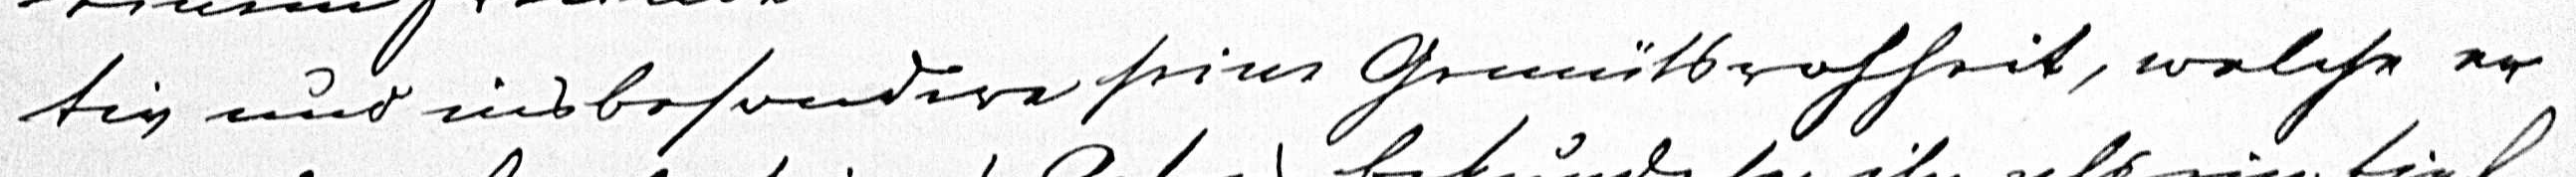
tiv und insbesondere seine Gemütsrohheit, welche er
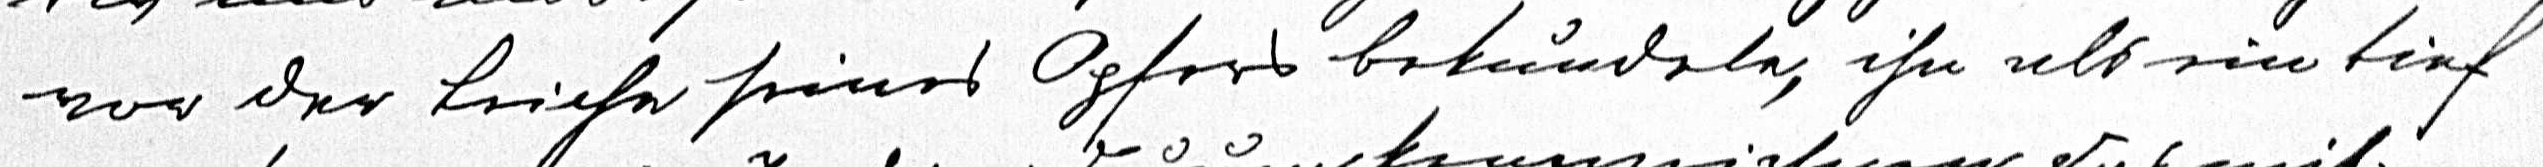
vor der Leiche seines Opfers bekundete, ihn als ein tief
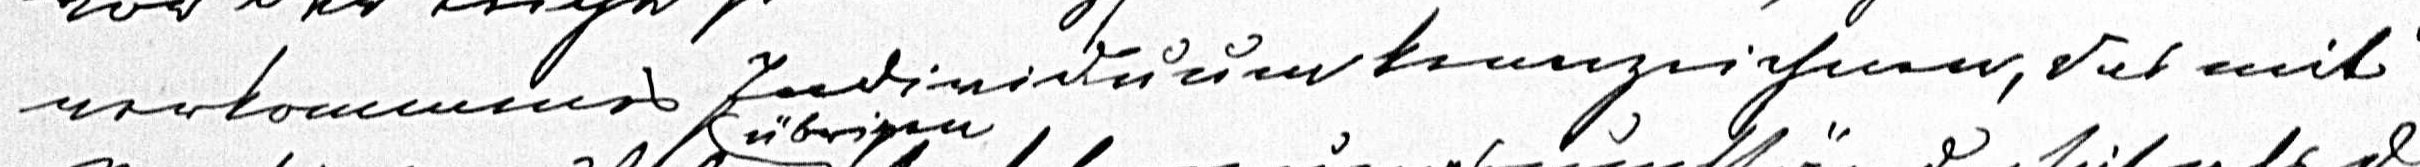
verkommenes Individuum kennzeichnen, das mit
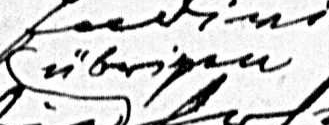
übrigen
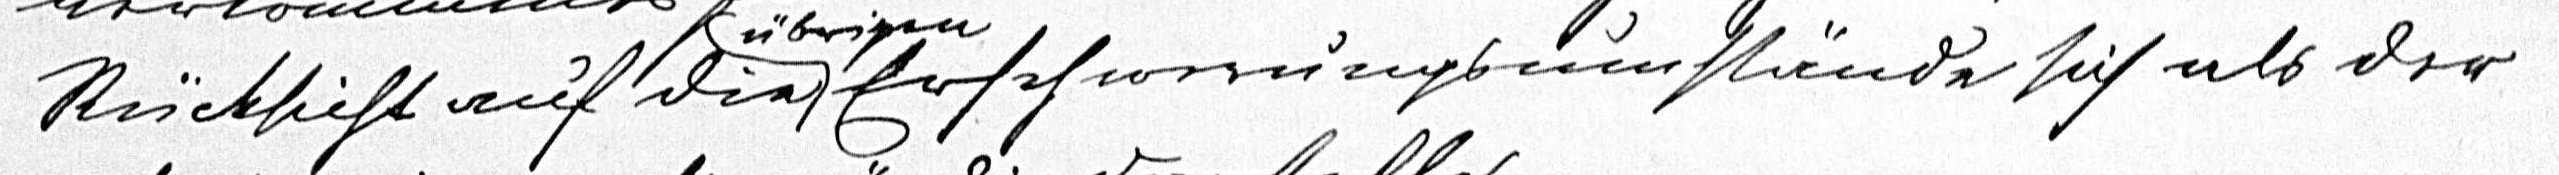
Rücksicht auf die Erschwerungsumstände sich als der
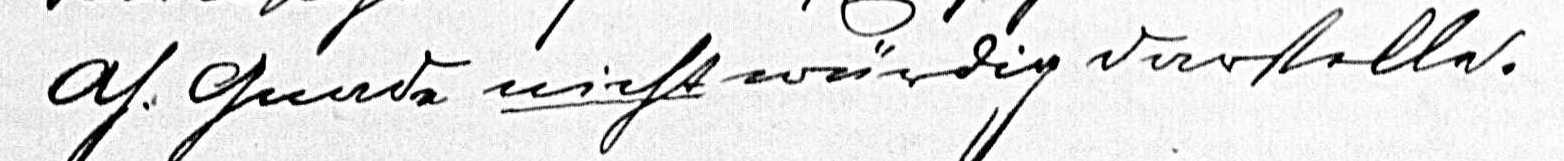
Ah. Gnade nicht würdig darstelle.
